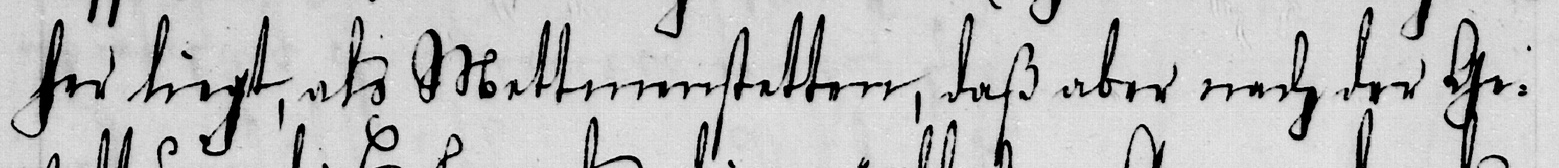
her liegt, als Mettmenstetten, daß aber nach der Ge¬
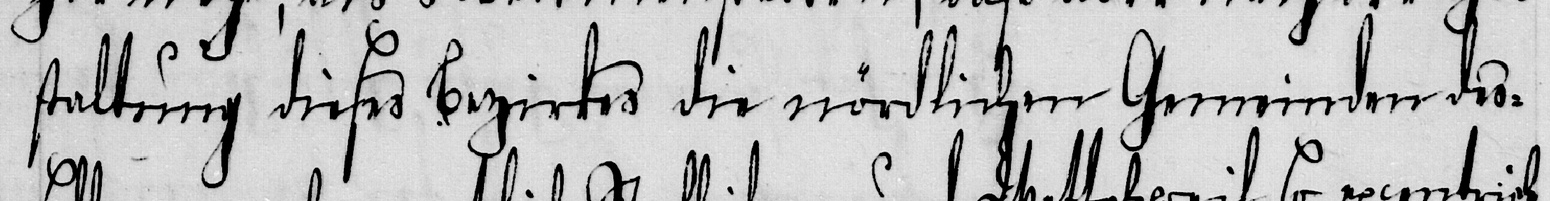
staltung dieses Bezirkes die nördlichen Gemeinden des¬
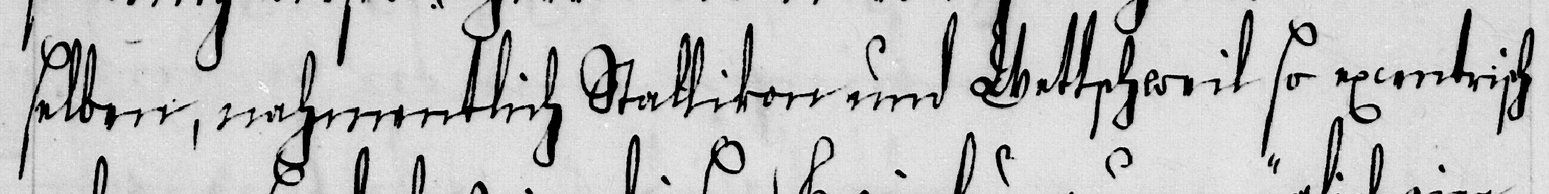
selben, nahmentlich Stallikon und Wettschweil so excentri¬
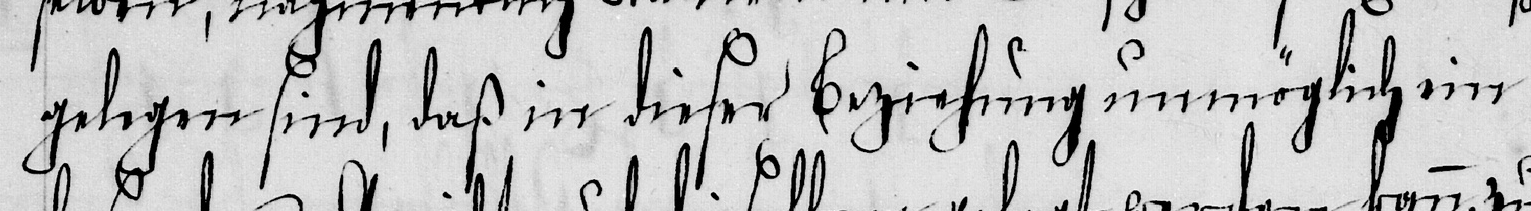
gelegen sind, daß in dieser Beziehung unmöglich ein
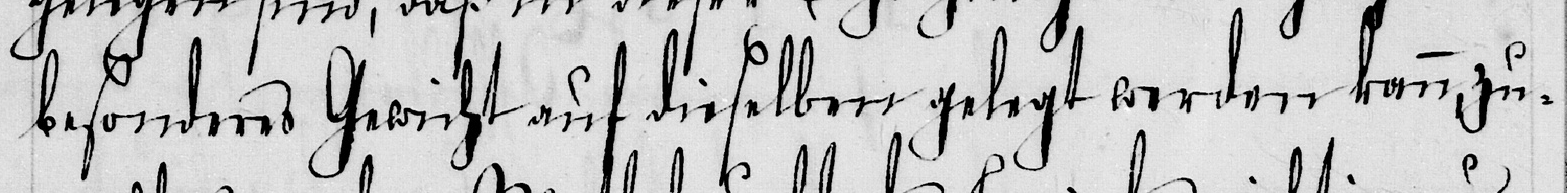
besonderes Gewicht auf dieselben gelegt werden kann, zu¬
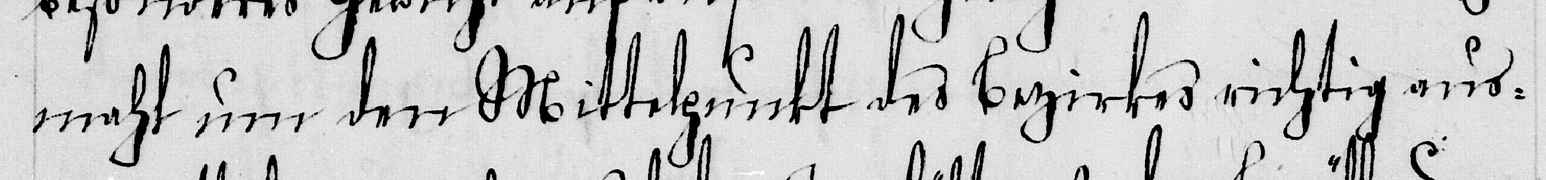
mahl um den Mittelpunkt des Bezirkes richtig aus¬
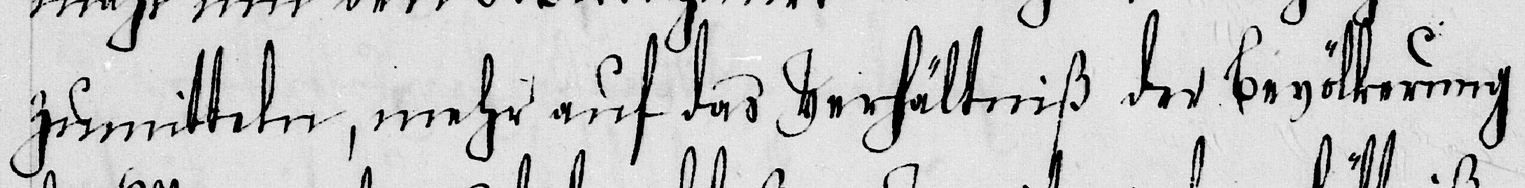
zumitteln, mehr auf das Verhältniß der Bevölkerung
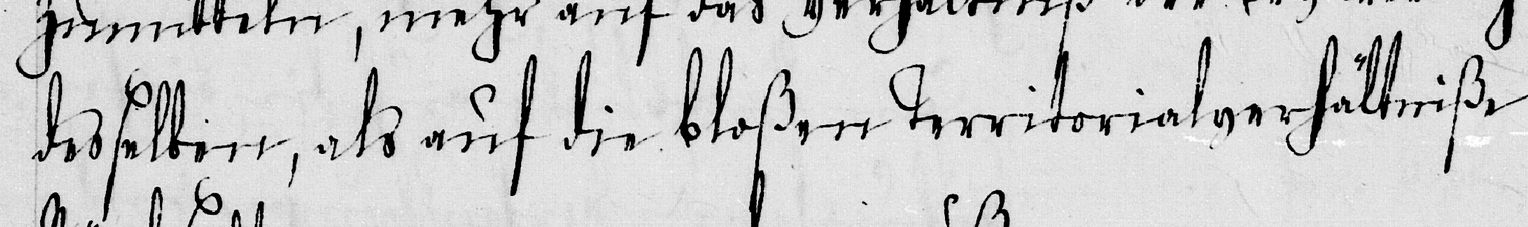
desselben, als auf die bloßen Territorialverhältniße
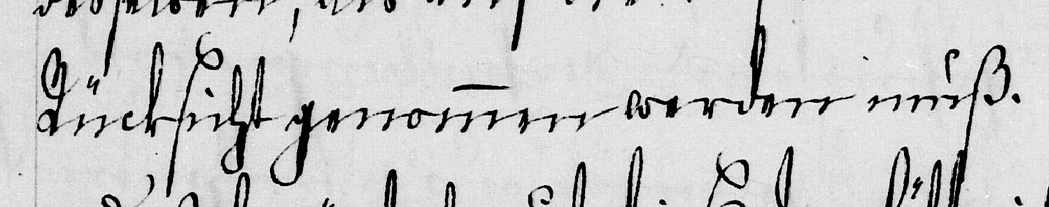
Rücksicht genommen werden muß.
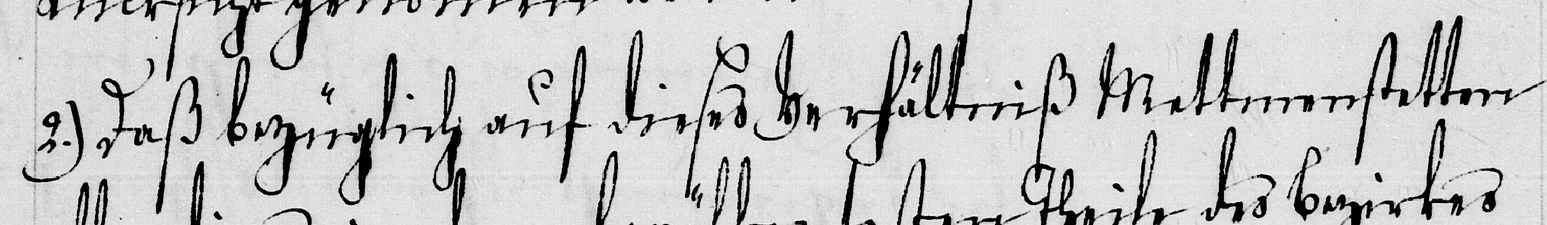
2.) Daß bezüglich auf dieses Verhältniß Mettmenstetten
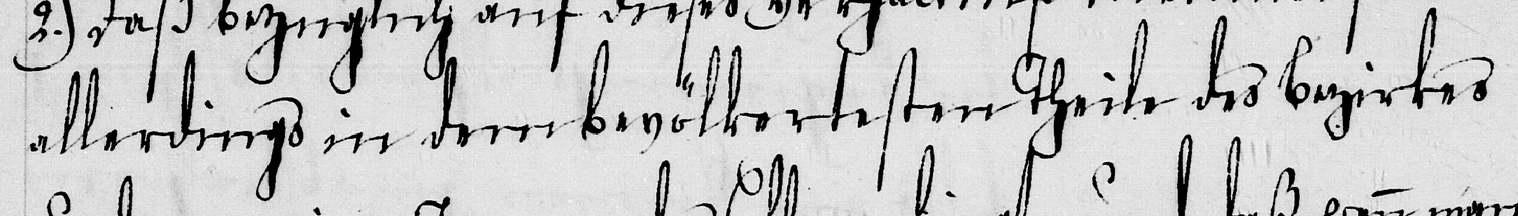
allerdings in dem bevölkertesten Theile des Bezirkes
